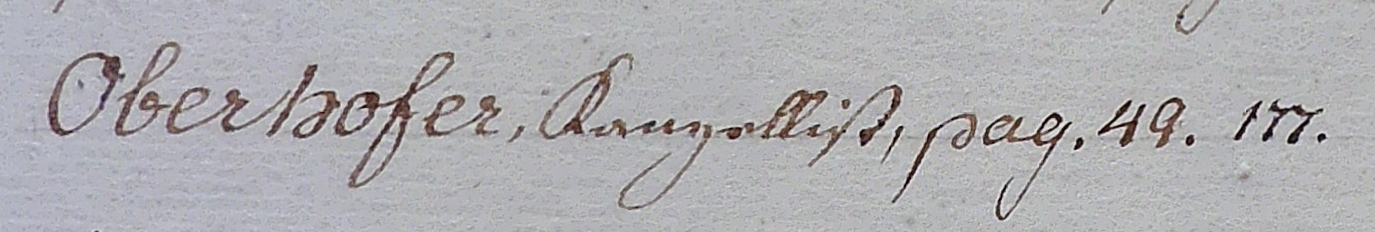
Oberhofer, Kanzellist, pag. 49. 177.
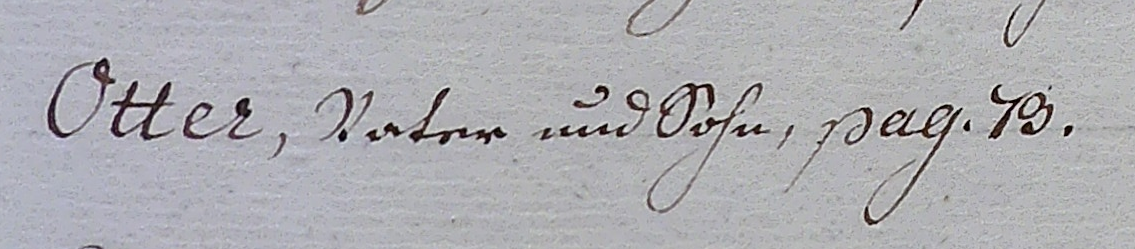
Otter, Vater und Sohn, pag. 73.
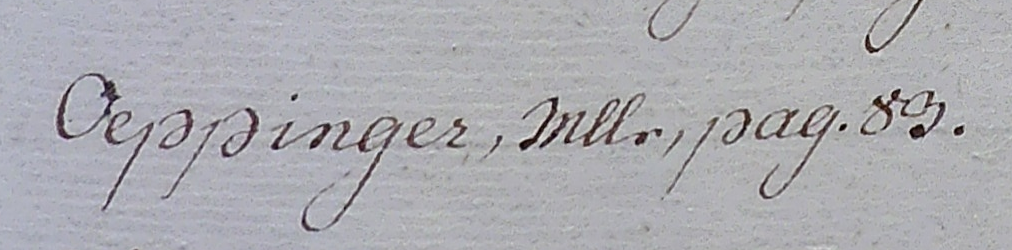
Oeppinger, Mlle, pag. 83.
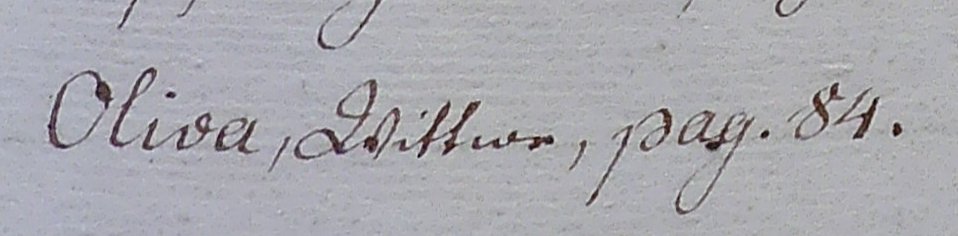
Oliva, Wittwe, pag. 84.
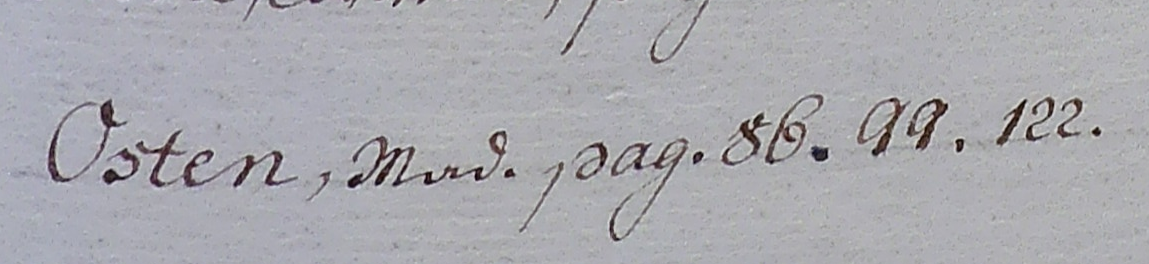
Osten, Mad. pag. 86. 99. 122.
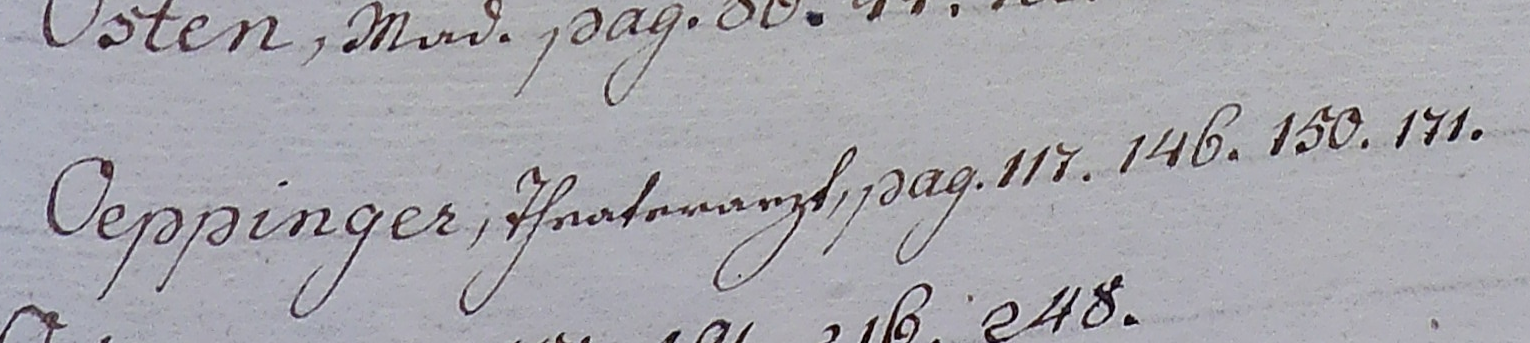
Oeppinger, Theaterarzt, pag. 117. 146. 150. 171.
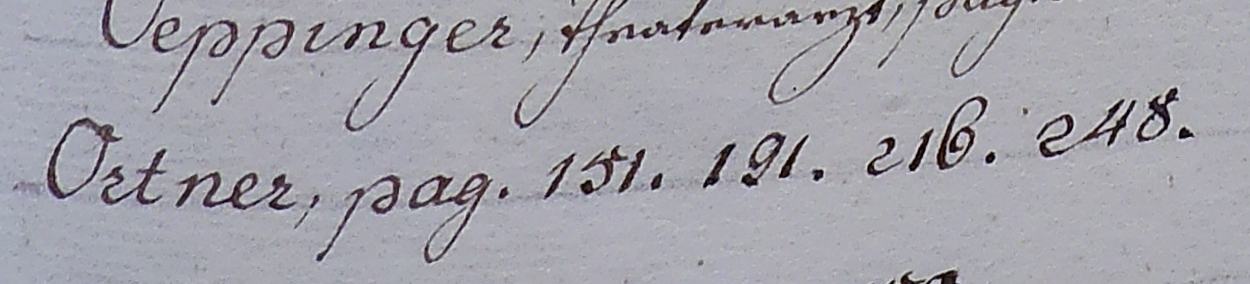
Ortner, pag. 151. 191. 216. 248.
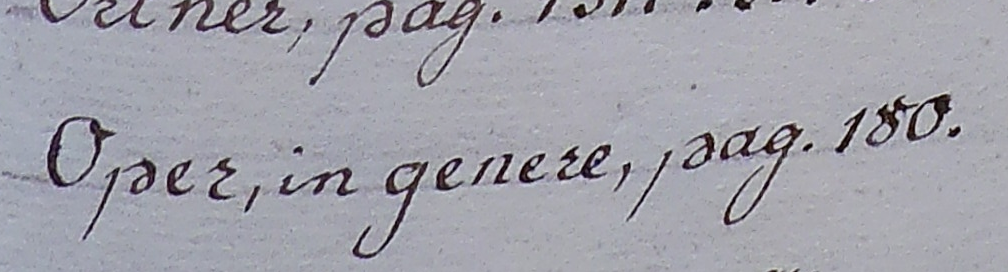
Oper, in genere, pag. 180.
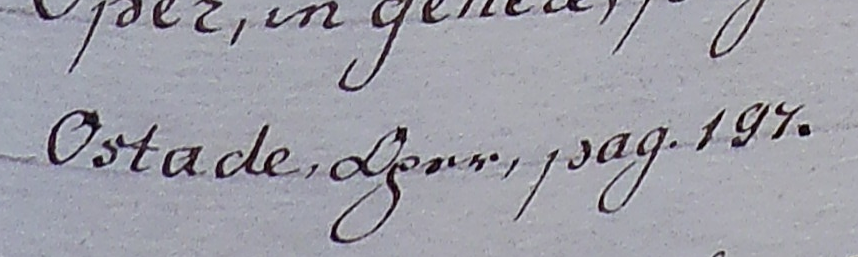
Ostade, Oper, pag. 197.
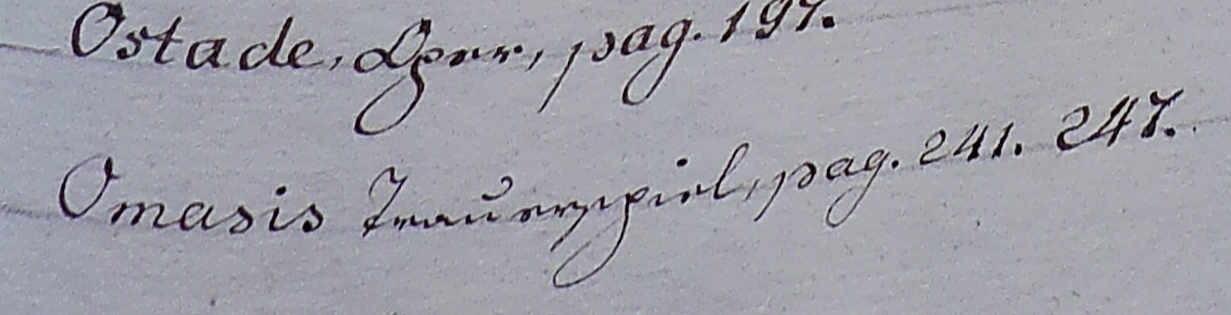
Omasis Trauerspiel, pag. 241. 247.
